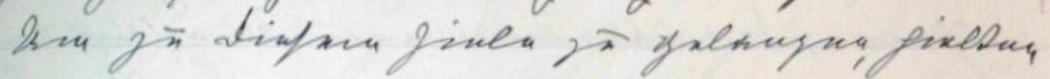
Um zu diesem Ziele zu gelangen, hielten
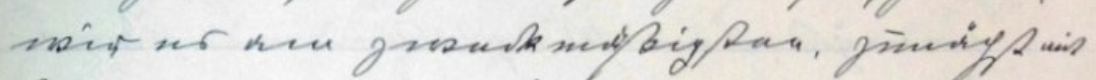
wir es am zweckmäßigsten, zunächst mir
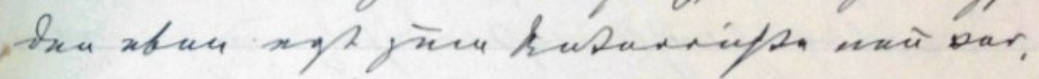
den eben erst zum Unterrichte neu ver
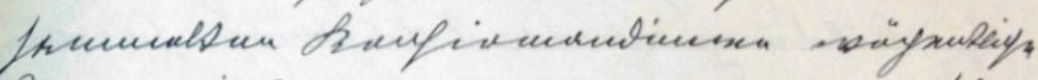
sammelten Konfirmandinnen wöchentliche
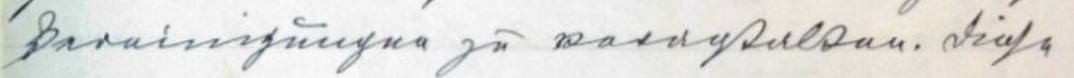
Vereinigungen zu veranstalten. Diese
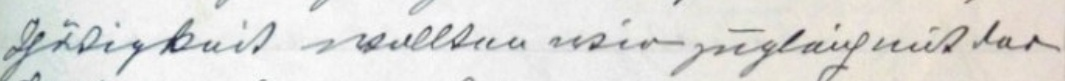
Thätigkeit wollten wir zugleich mit der
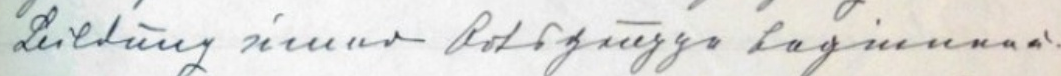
Bildung einer Ortsgruppe beginnen
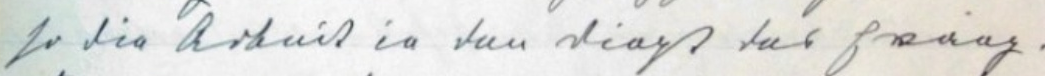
u. so die Arbeit in den Dienst des Evang.
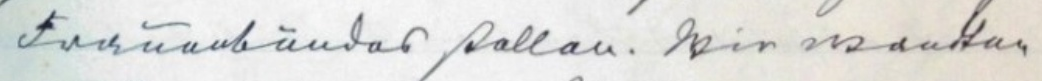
Frauenbundes stellen. Wir wandten
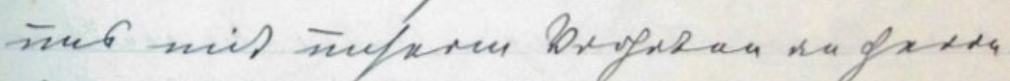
uns mit unserem Vorhaben an Herrn
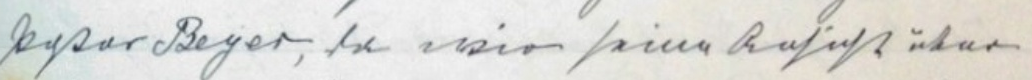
Pastor Beyer, da wir seine Ansicht über
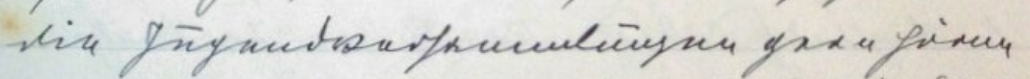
die Jugendversammlungen gern hören
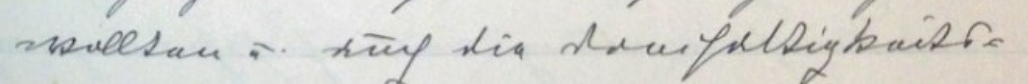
wollten u. auch die Dreifaltigkeits-
